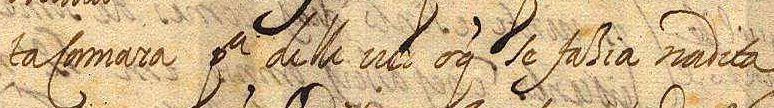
ta Camara pa delle uer o q̄ se fazia na dita
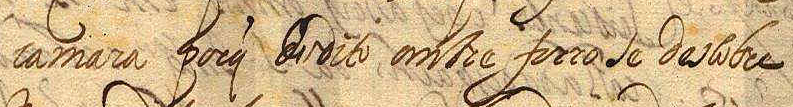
camara porq̄ do dito antre forro se descobre
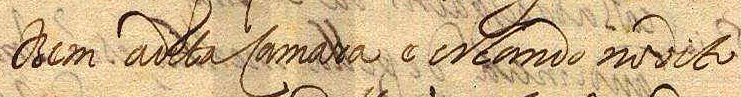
Bem a dita Camara, e estando no dito
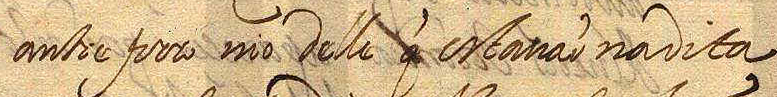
antre forro uio delle q̄ estauaõ na dita
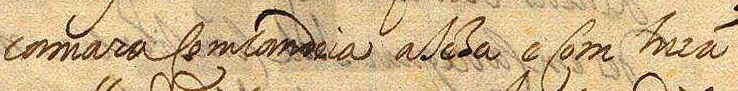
camara Com candeia aseza e Com huā
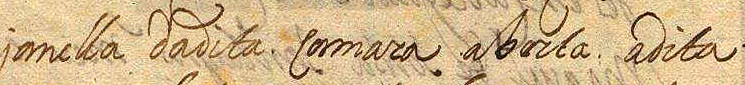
janella da dita Camara aberta a dita
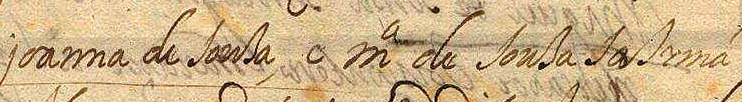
joanna de Souza, e ma de Souza sa Irmā
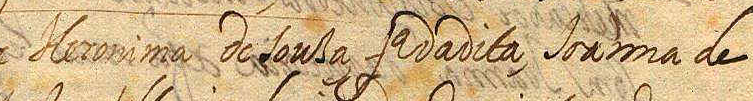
e Heronima de souza, fa da dita Ioanna de
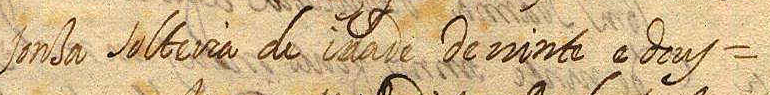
souza solteira de idade de uinte e dous
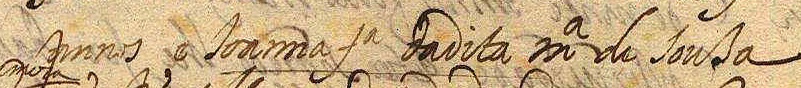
Annos e Ioanna fa da dita ma de Souza
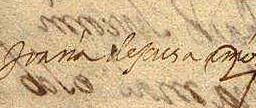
Joana de sousa a moca
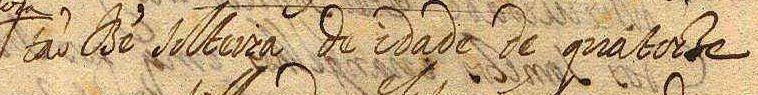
taõBē solteira de idade de quatorze
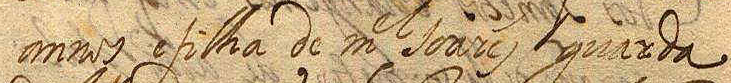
annos e filha de mel soares guarda
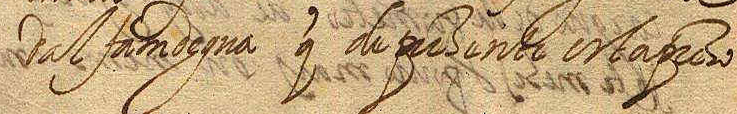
dalfamdegua q̄ de prezente esta prezo
